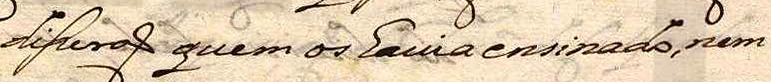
disseraõ quem os hauia ensinado, nem
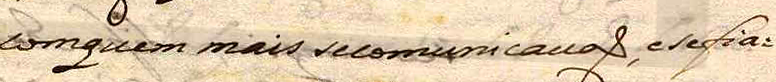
com quem mais se comunicauaõ, e se fia
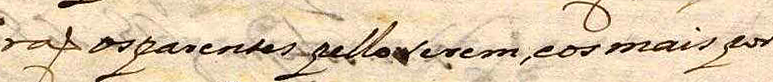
raõ os parentes pello serem, e os mais por
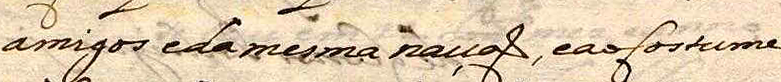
amigos e da mesma nacçaõ, e ao Costume
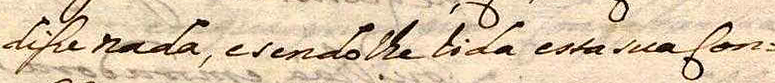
disse nada, e sendolhe lida esta sua Con
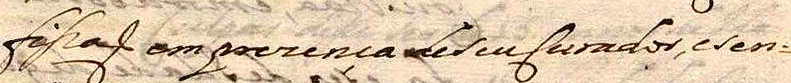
fissaõ em prezença de seu Curador, e sen
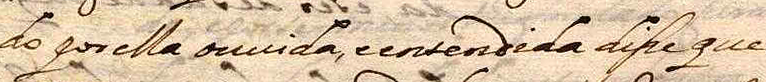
do por ella ouuvida, e entendida disse que
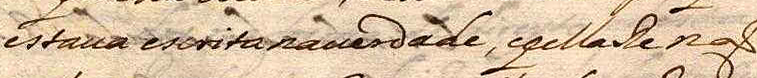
estaua escrita na uerdade, e pella Re naõ
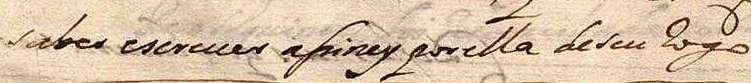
saber escreuer assiney por ella de seu Rogo
